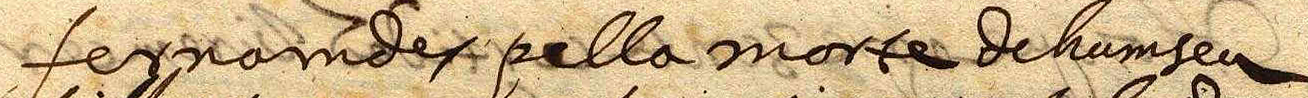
fernamdes pella morte de hum seu
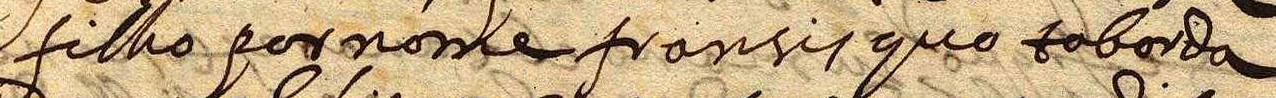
filho por nome fransisquo taborda
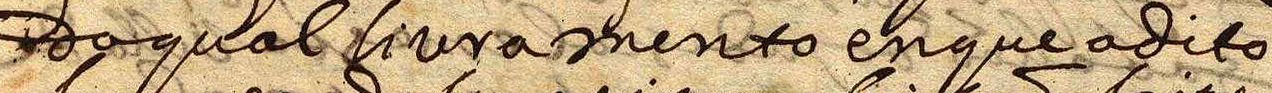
do qual livramento en que o dito
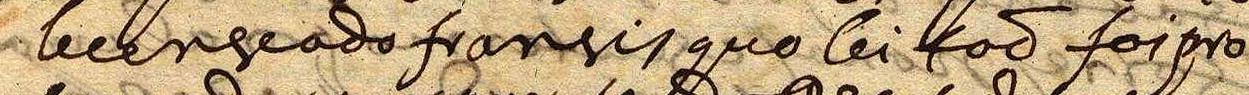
lecenseado fransisquo leitaõ foi pro
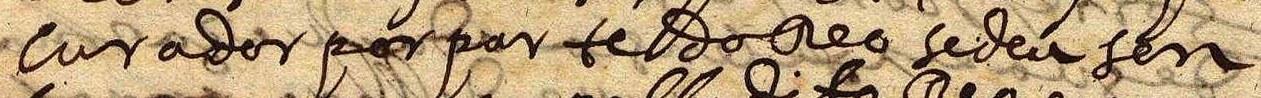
curador por parte do Reo se deu sen
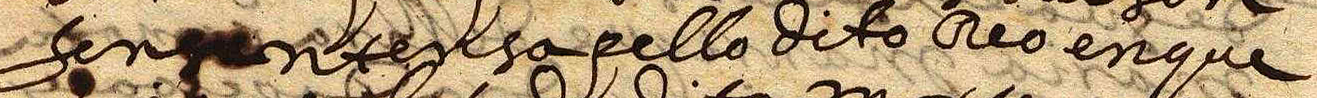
ten sentensa pello dito Reo en que
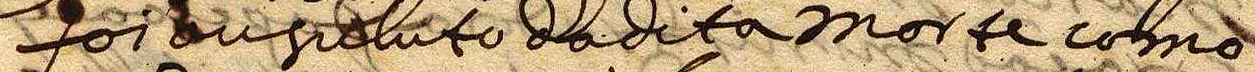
foi ausuluto da dita morte como
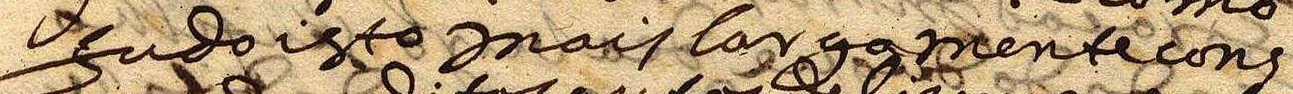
tudo isto mais largamente cons
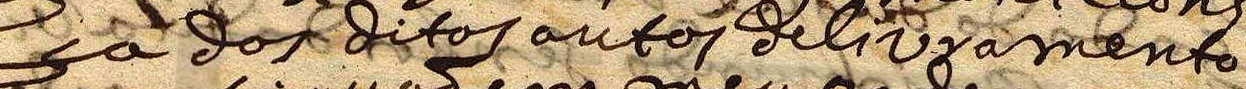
ta dos ditos autos de livramento
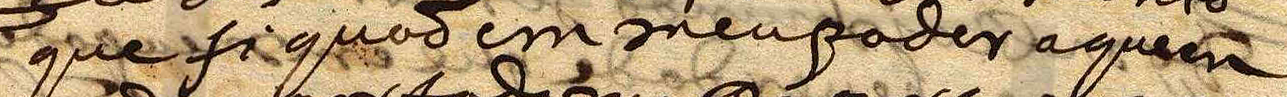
que fiquaõ em meu poder a que en
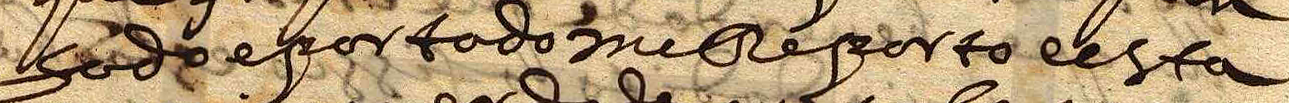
todo e por todo me Reporto e esta
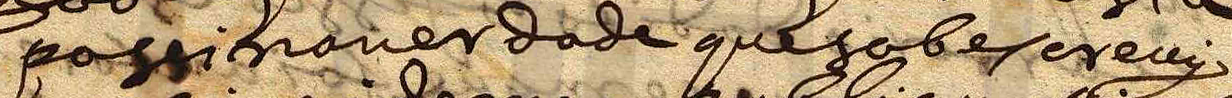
pasei na uerdade que sobescreuy
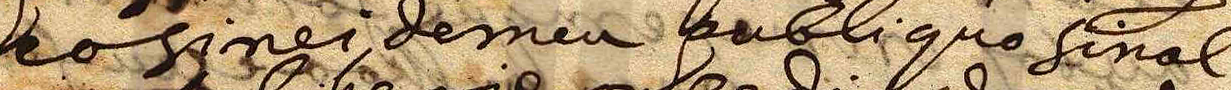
e asinei, de meu publiquo sinal
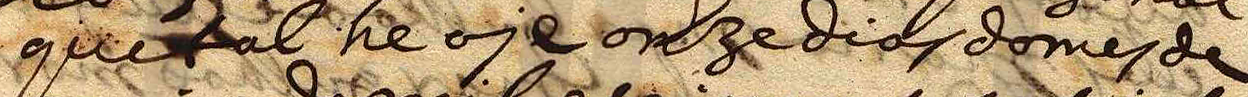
que tal he oje onze dias do mes de
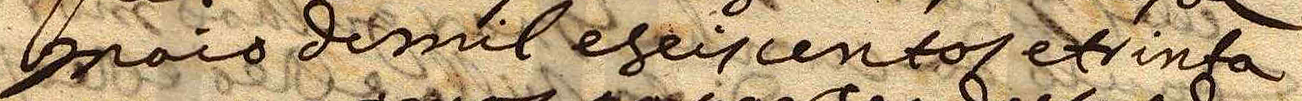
maio de mil e seiscentos e trinta
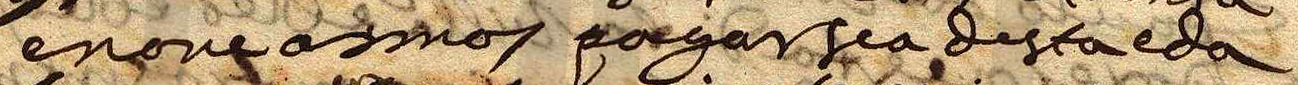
e noue annos pagarsea desta e da
